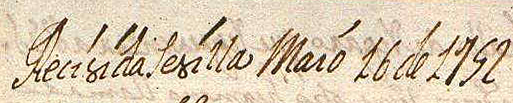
Recivida Sevilla Maio 16 de 1752
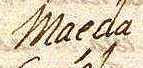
Maeda
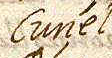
Curiel
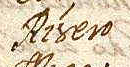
Rivero
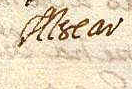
Alvear
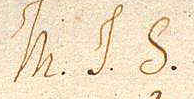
M. I. S.
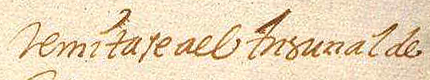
remitase a el trivunal de
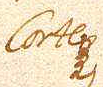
Corte
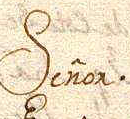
Señor.
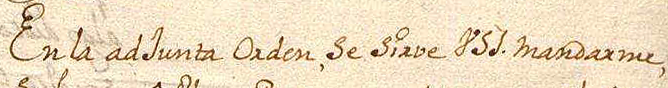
En la adjunta Orden, se Sirve VSI. mandarme,
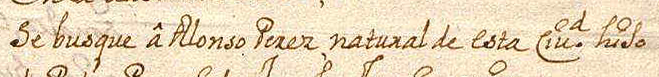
se busque â Alonso Perez, natural de esta Ciu.d hijo
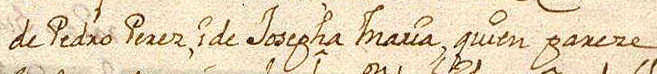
de Pedro Perez, i de Iosepha Maria, quien pareze
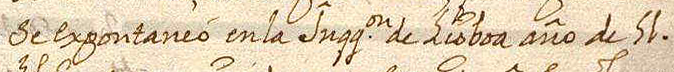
se expontaneó en la Inqq.on de Lisboa año de 51.
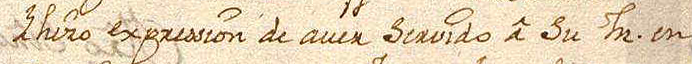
Y hizo expression de auer servido â su M. en
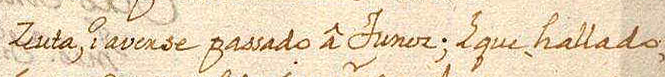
Zeuta, i averse passado â Tunez; Y que hallado,
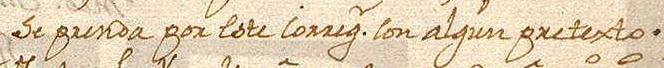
se prenda por este correg.r con algun pretexto.
